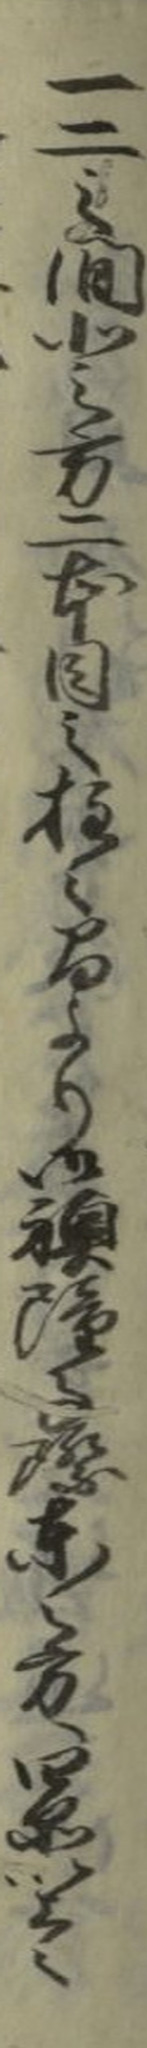一二之間北之方二本目之柱之間より御襖障子際東之方へ四品以上之
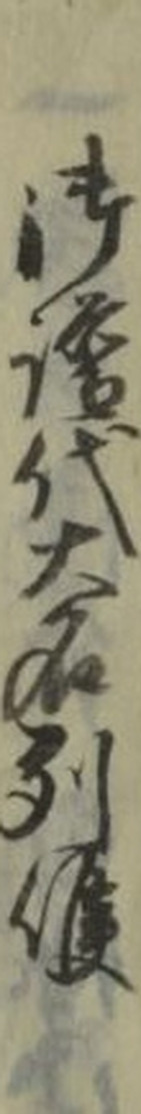御譜代大名列候
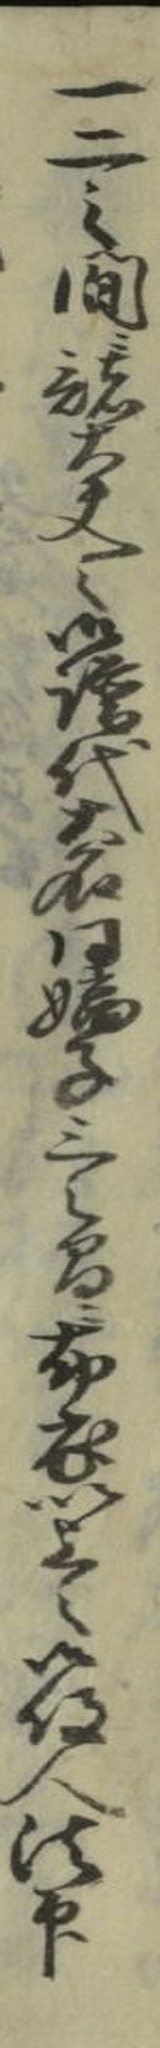一二之間に諸大夫之御譜代大名同嫡子三之間に布衣以上之御役人法印
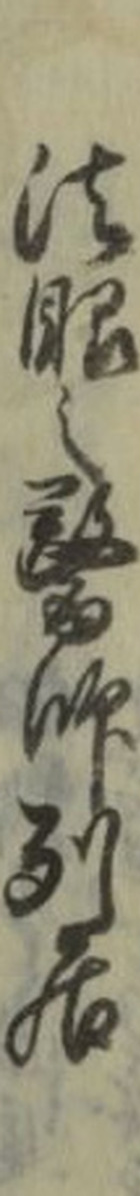法眼之医師列居
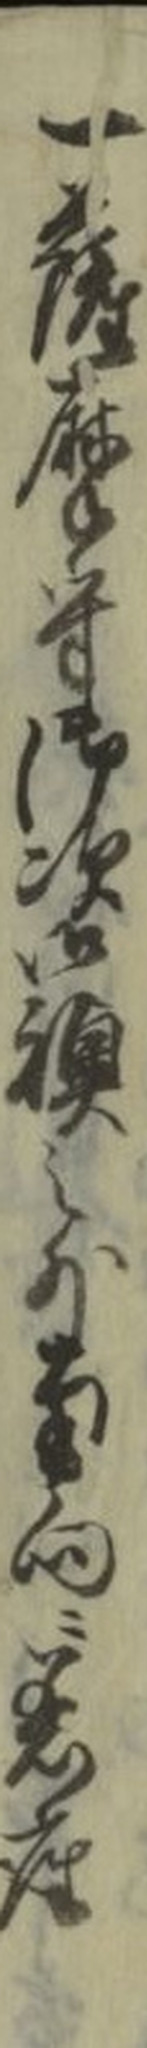一薩摩守御次御襖之外南向に着座
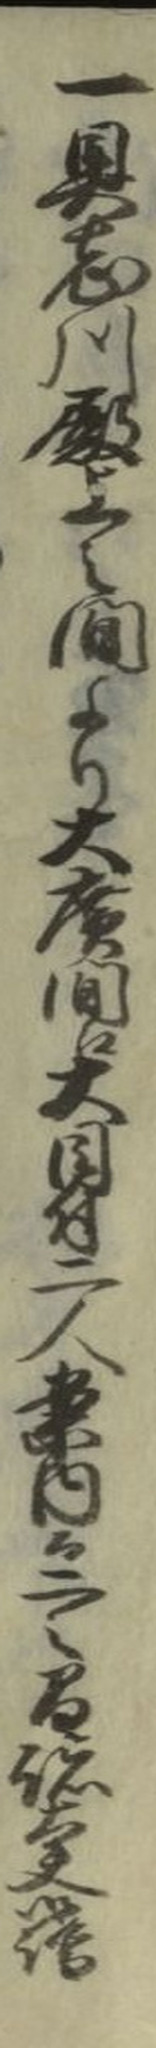一具志川殿上之間より大広間え大目付二人案内而ニ之間
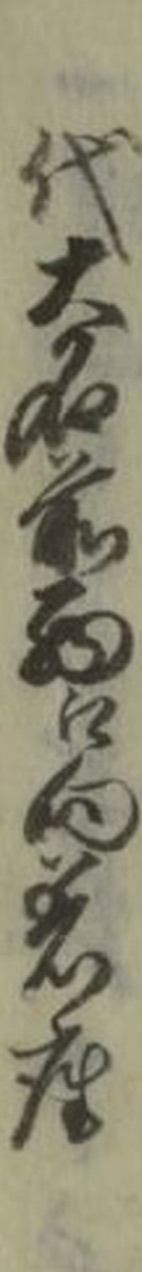代大名前面え向着座
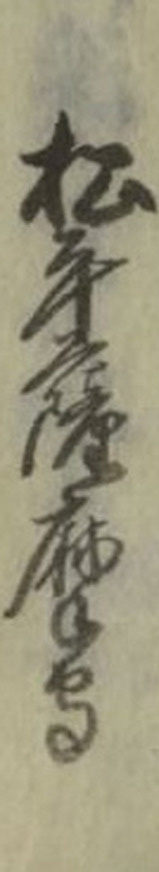松平薩摩守
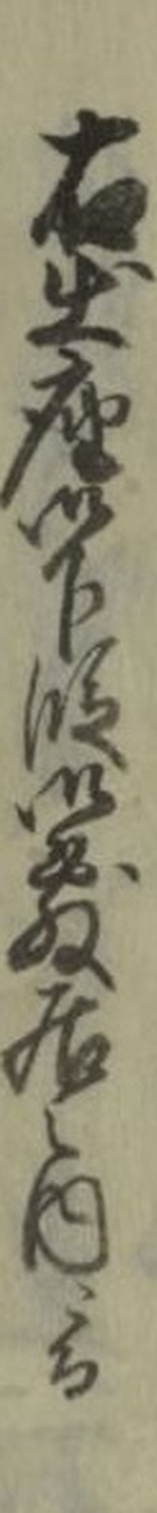右出席御下段御敷居之内に而
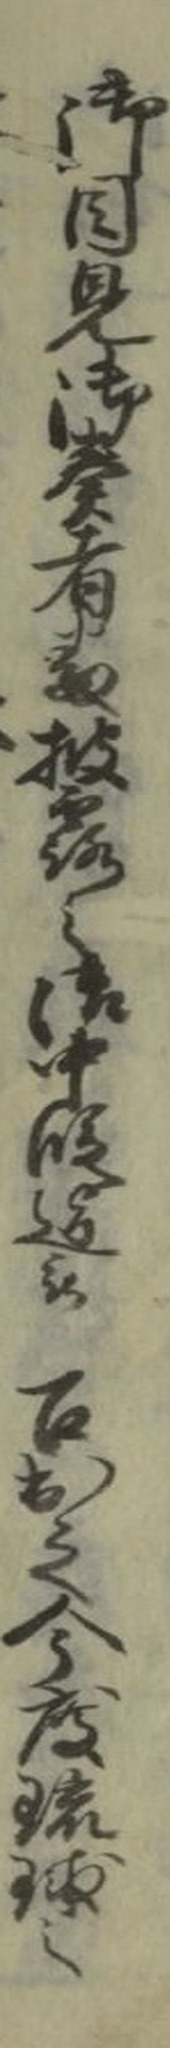御目見御奏者番披露之御中段迠被召出之今度琉球之
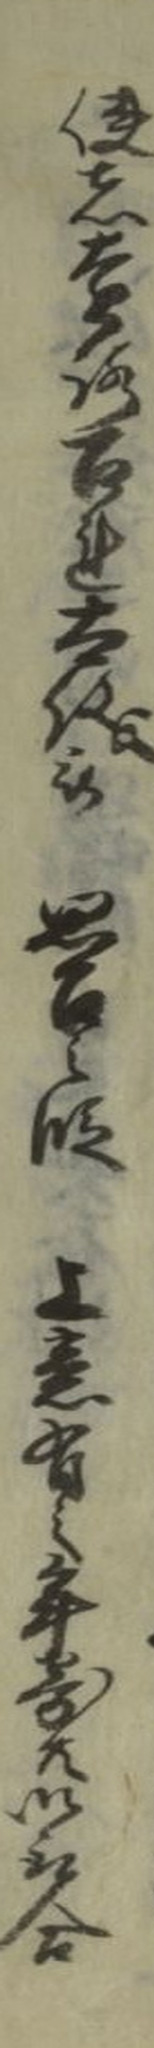使者遠路召連大儀被思召之段上意有之年寄共御取合

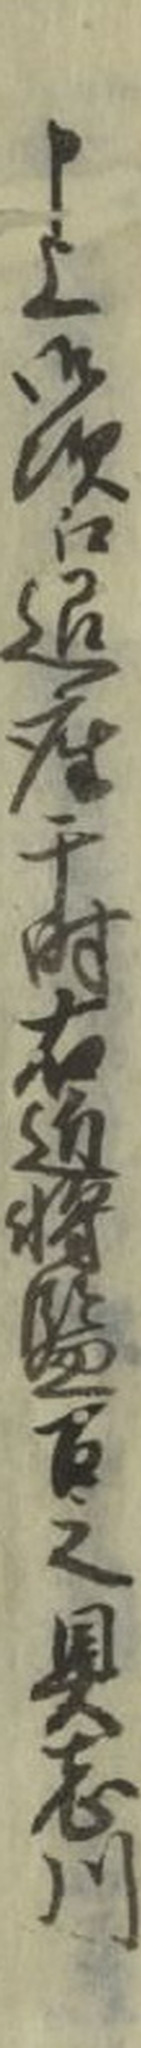申上御次え退座于時右近将監召之具志川
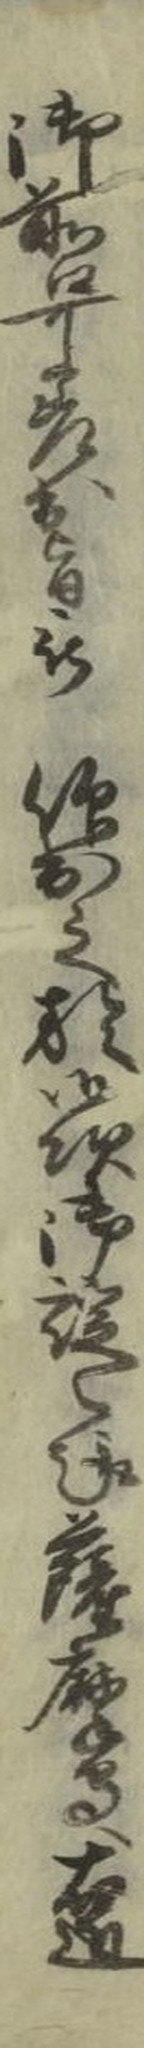御前え可差出旨被仰出之於御次御諚之趣薩摩守へ右近
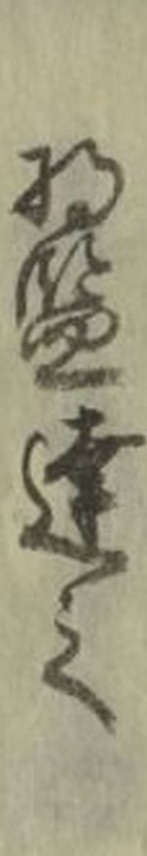将監達之
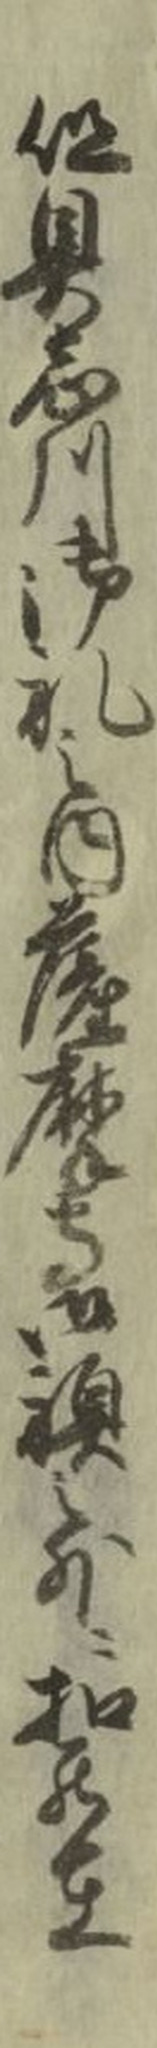但具志川御礼之内薩摩守御襖之外に扣罷在
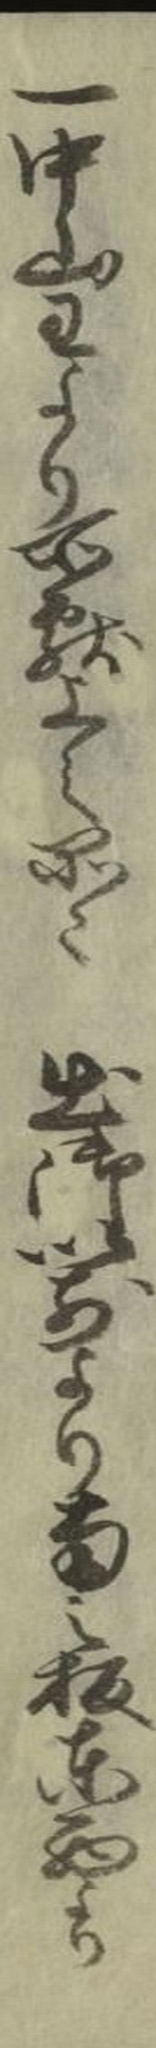一中山王より所献上之品々出御以前より南之板東西より
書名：琉球人来朝之記
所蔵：University of the Ryukyus Library
